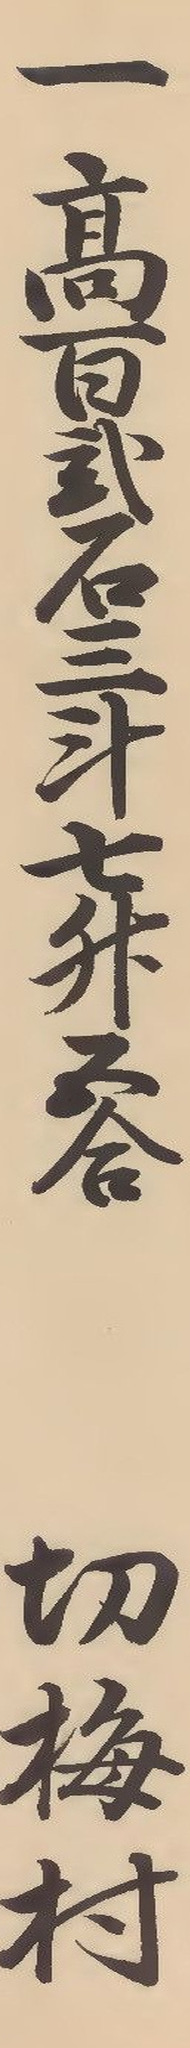一高百弐石三斗七升五合切梅村
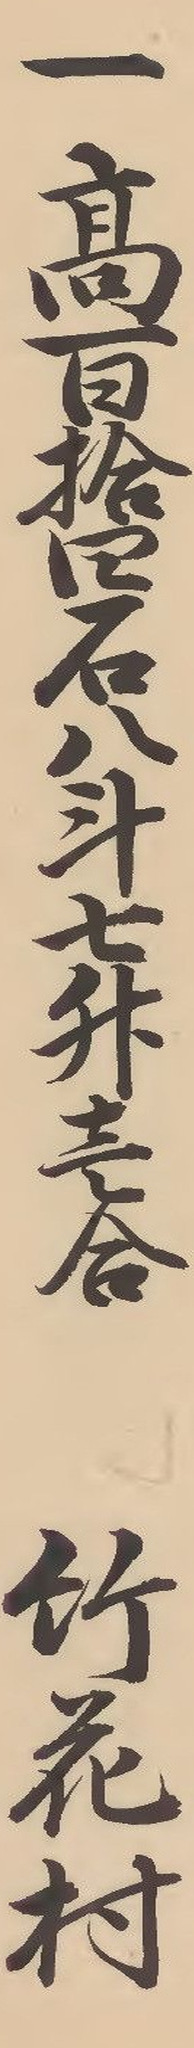一高百拾四石八斗七升壱合竹花村

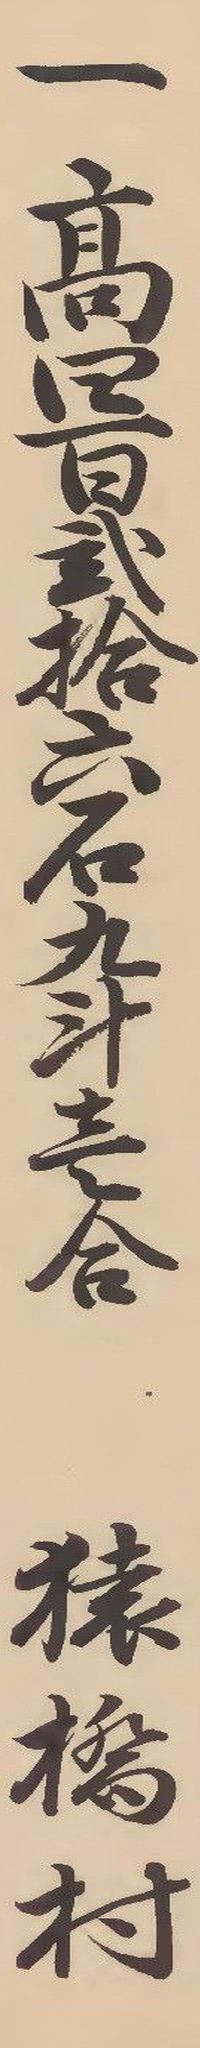一高四百弐拾六石九斗壱合猿橋村
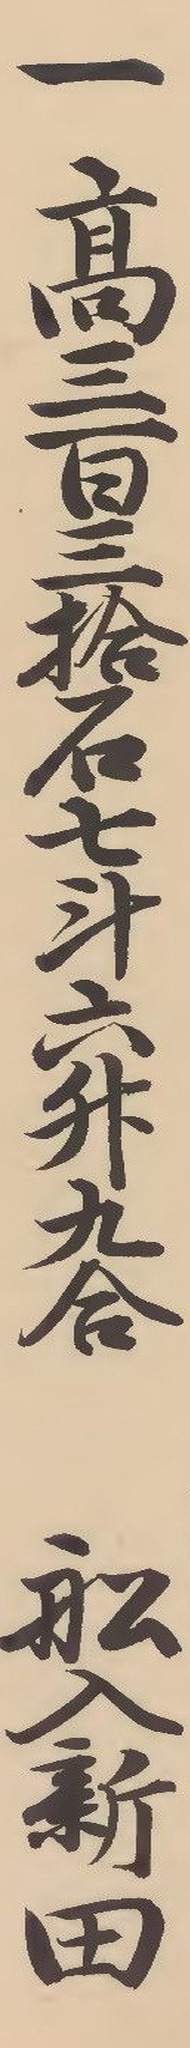一高三百三拾石七斗六升九合船入新田
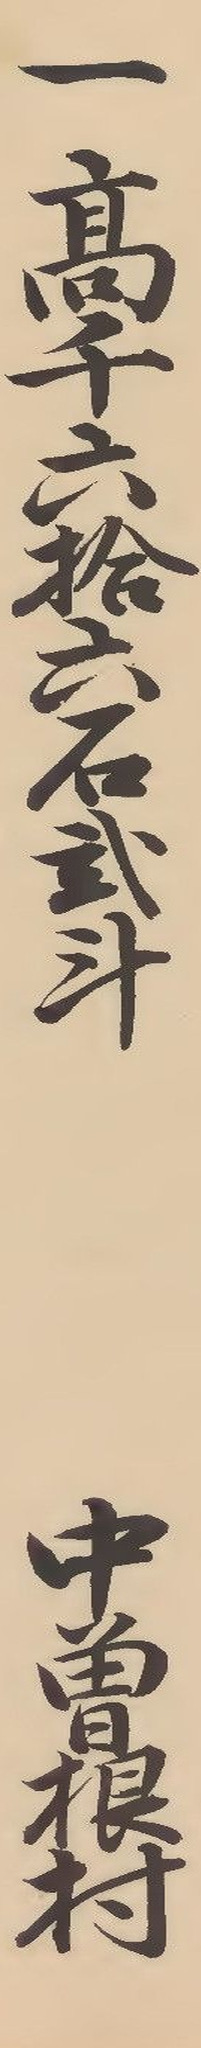一高千六拾六石弐斗中曽根村
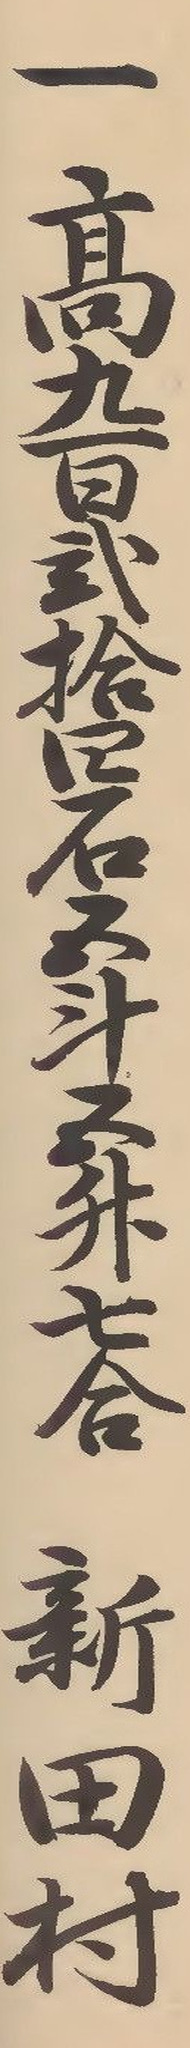一高九百弐拾四石五斗五升七合新田村
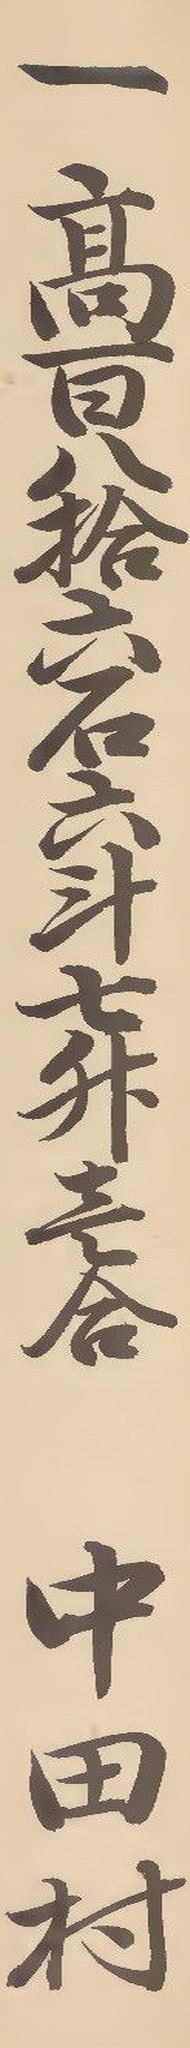一高百八拾六石六斗七升壱合中田村
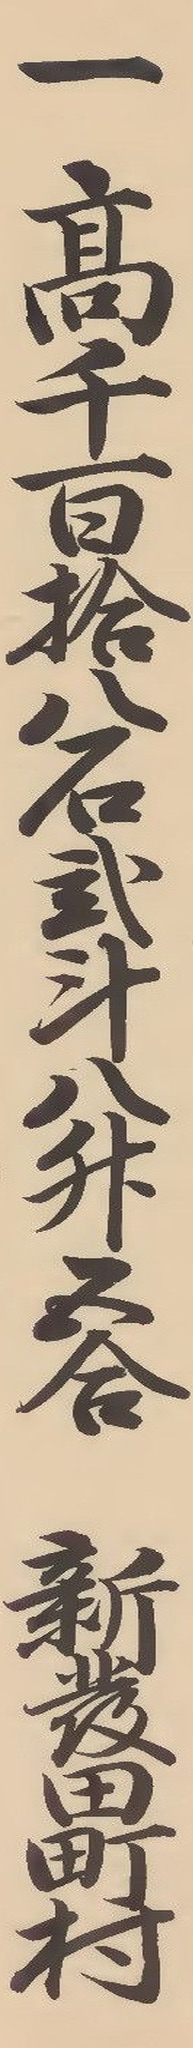一高千百拾八石弐斗八升五合新発田町村
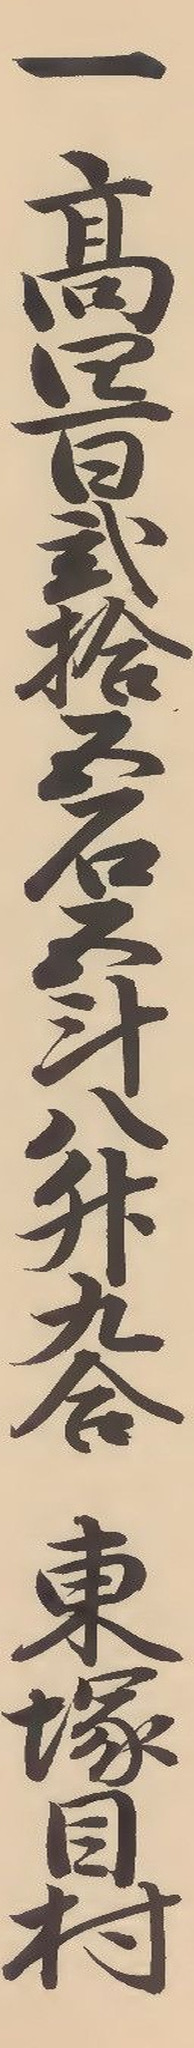一高四百弐拾五石五斗八升九合東塚目村
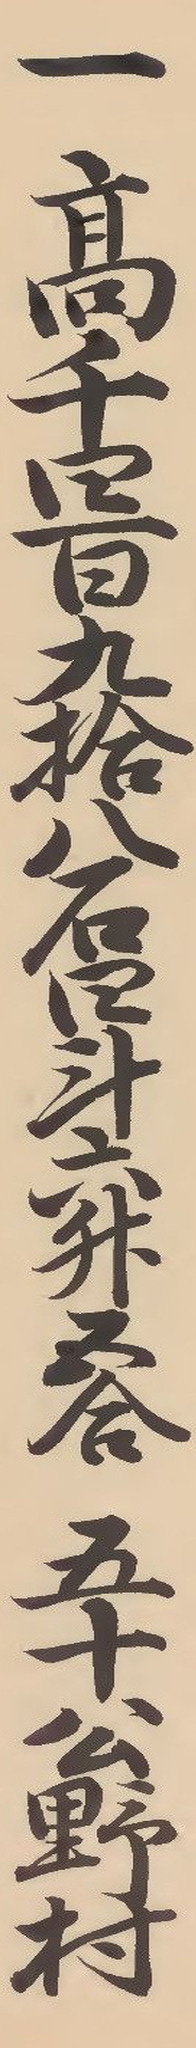一高千四百九拾八石四斗六升五合五十公野村

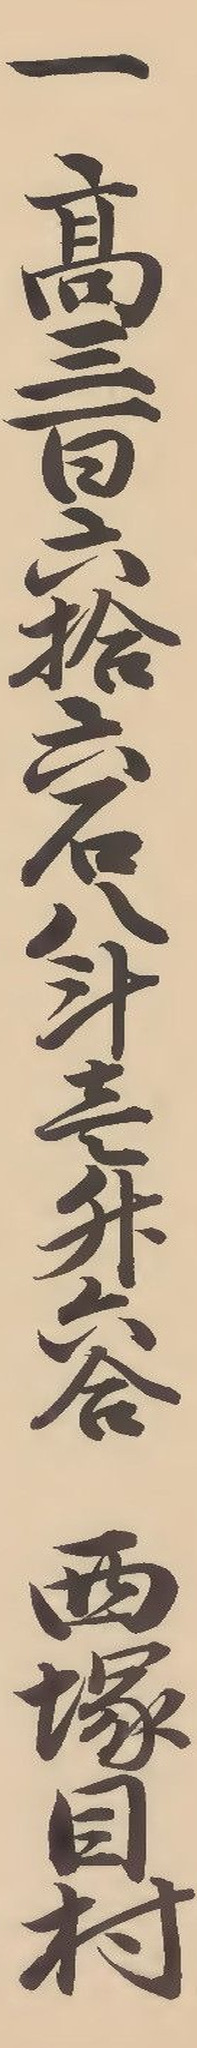一高三百六拾六石八斗壱升六合西塚目村
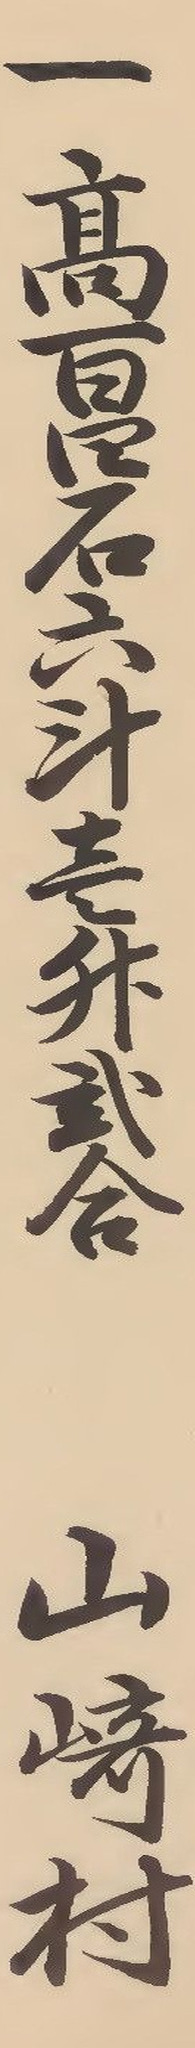一高百四石六斗壱升弐合山崎村
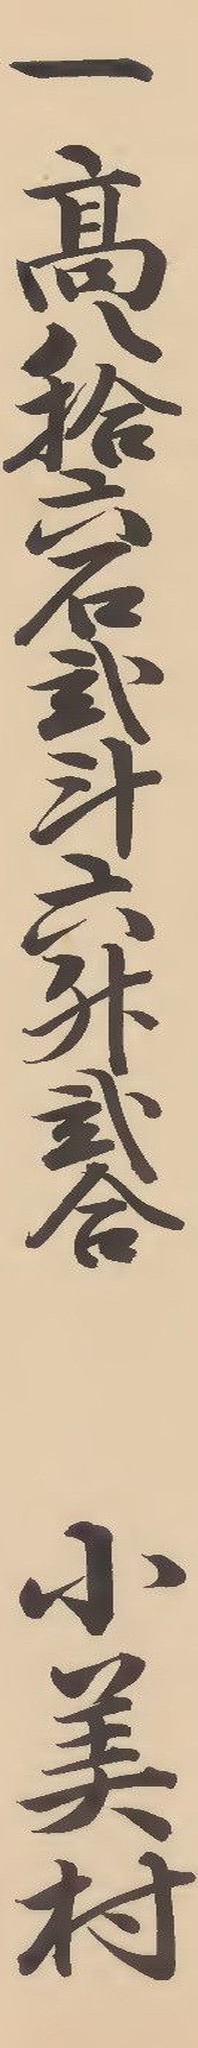一高八拾六石弐斗六升弐合小美村
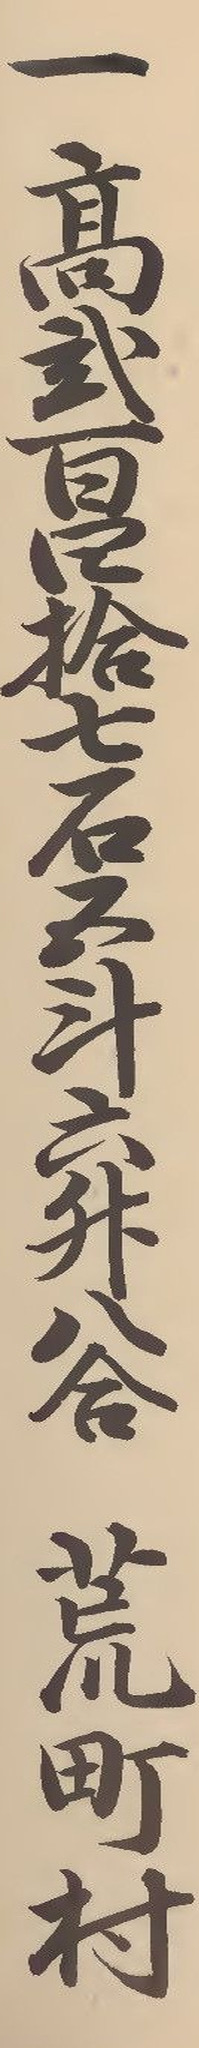一高弐百四拾七石五斗六升八合荒町村
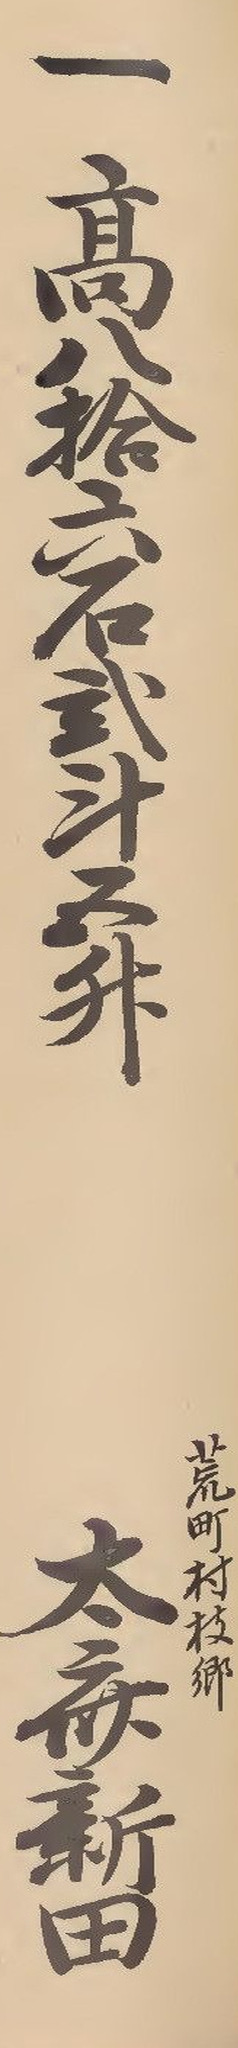一高八拾六石弐斗五升太斎新田
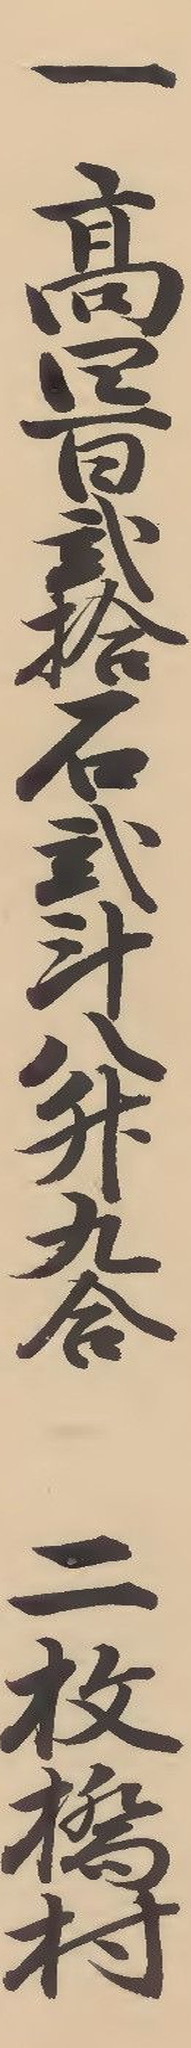一高四百弐拾石弐斗八升九合二枚橋村
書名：越後国郷帳　下
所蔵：国立公文書館 National Archives of Japan
